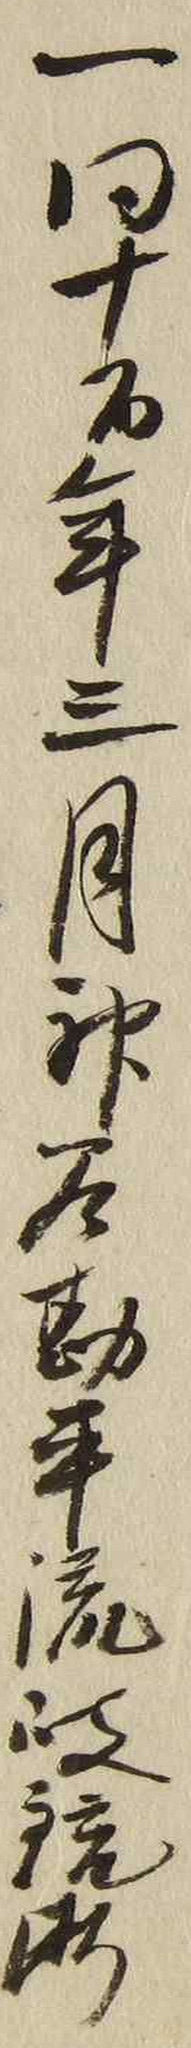一同十酉年三月神石勘平流岐銃術
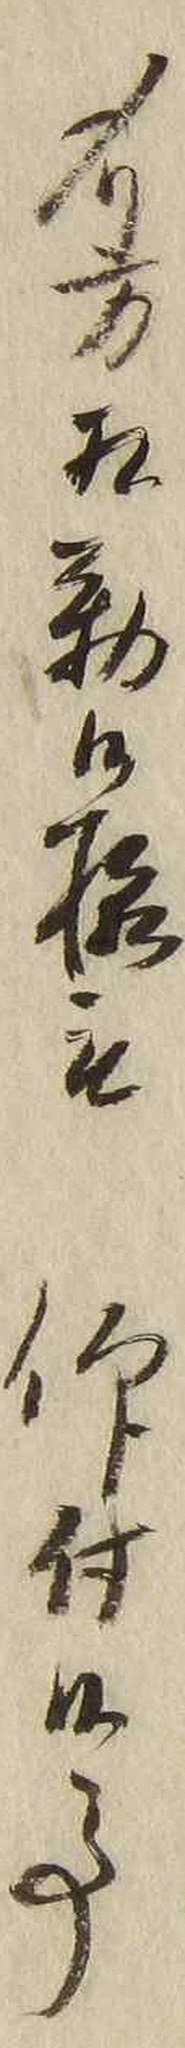有方相勤候様被仰付候事
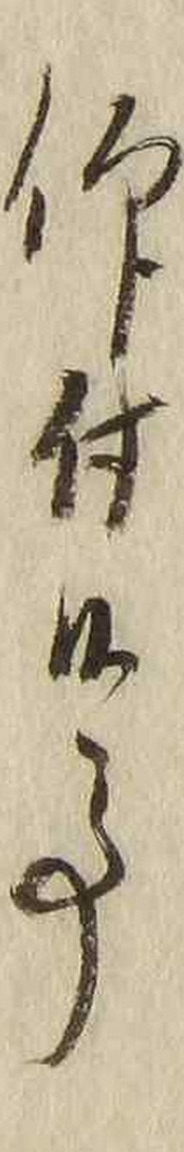仰付候事

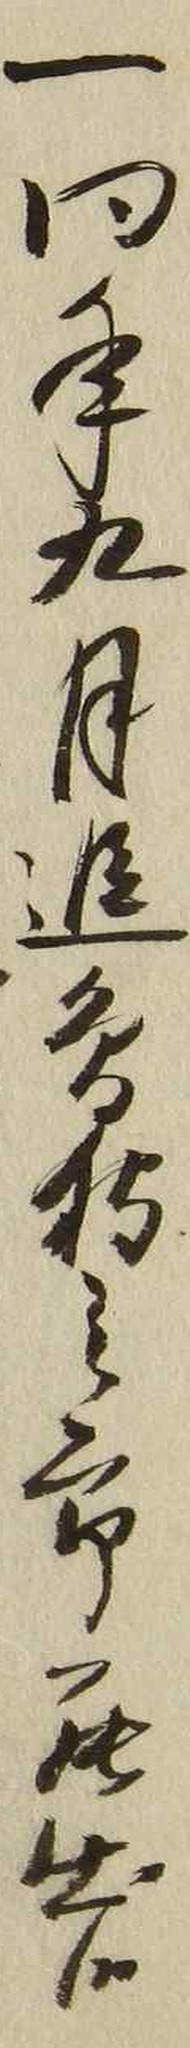一同年九月追鳥狩之節罷出候
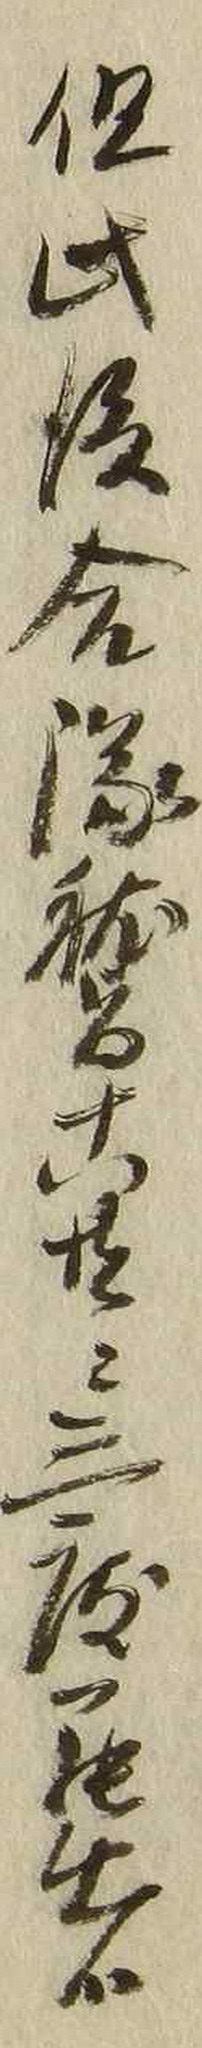但此後合隊稽古共に三度罷出候
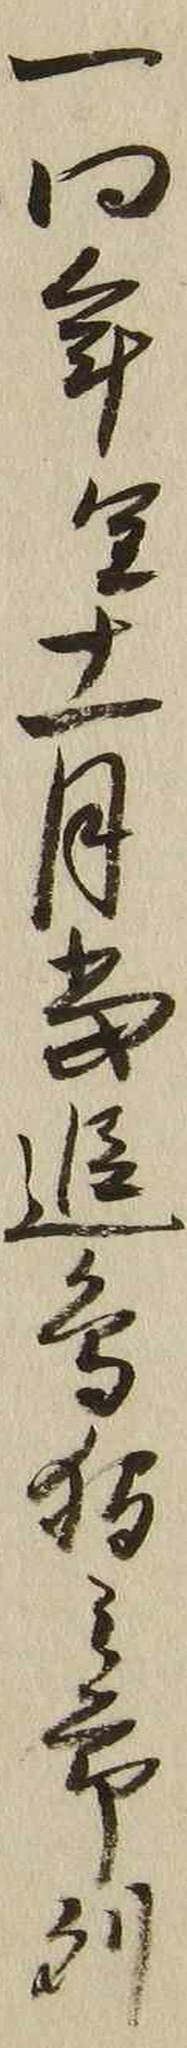一同年閏十一月当追鳥狩之節列
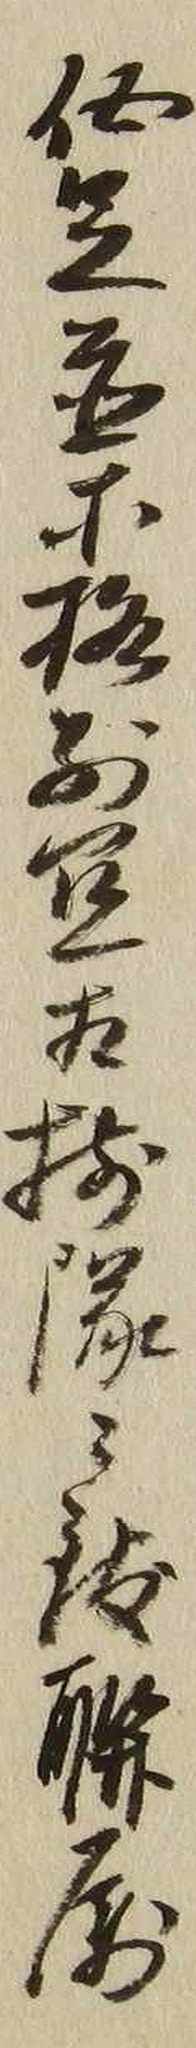伍足並等格別宜相揃隊々致聯属
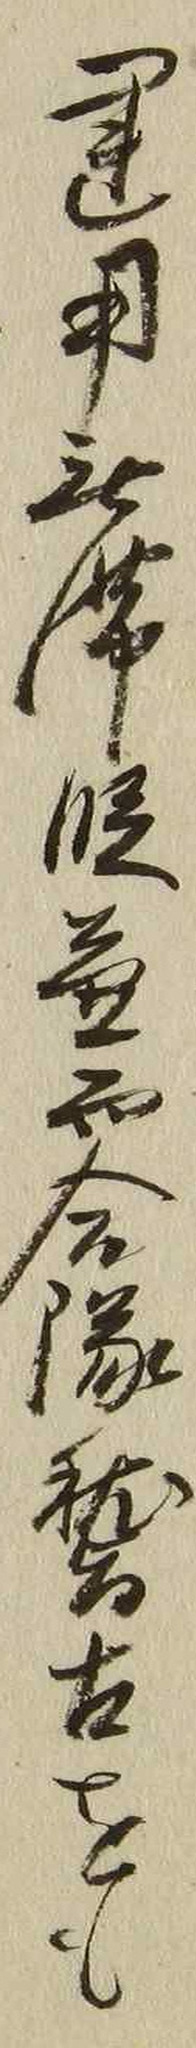運用無滞段兼而合隊稽古をも
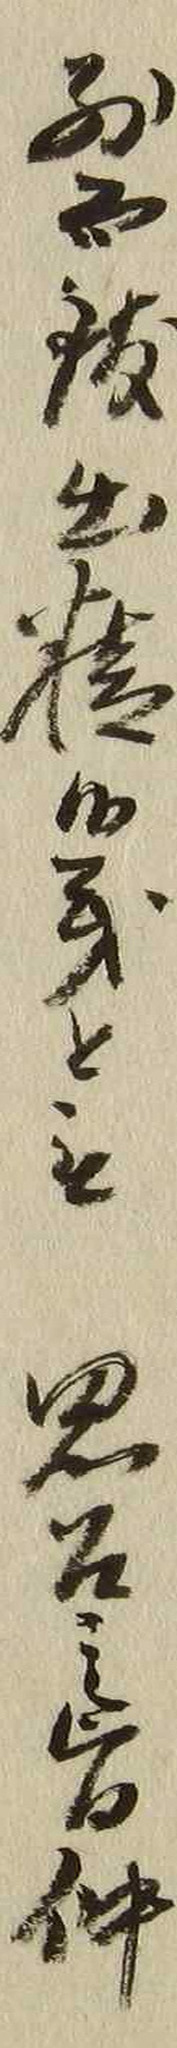別而致出精候義とも被思召之旨仲
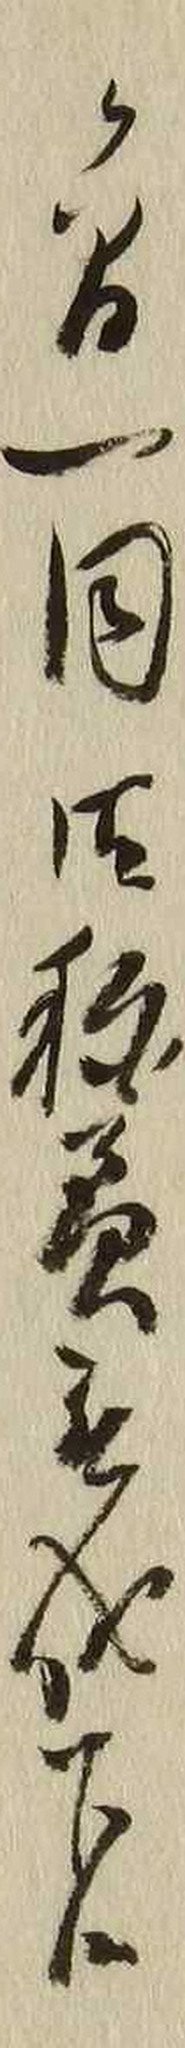け間一同御称美被成下候
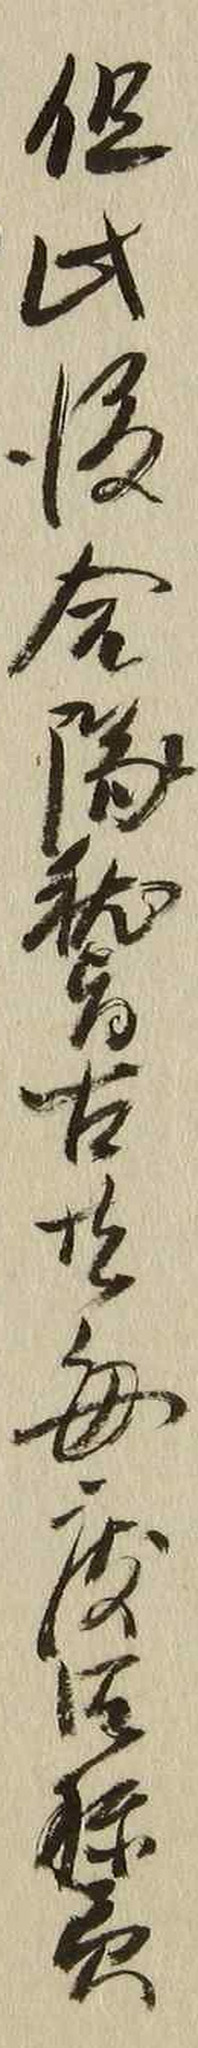但此後合隊稽古共毎度御称美
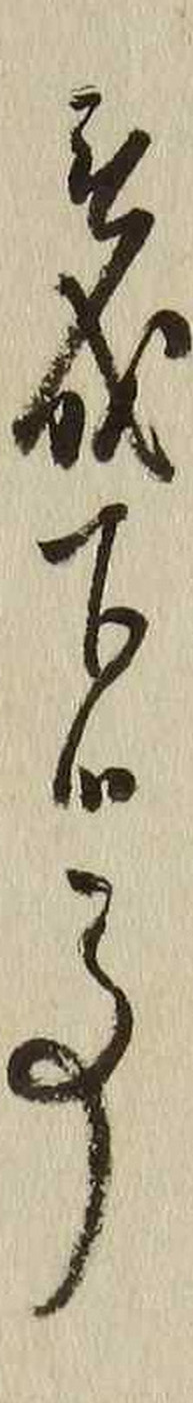被成下候事
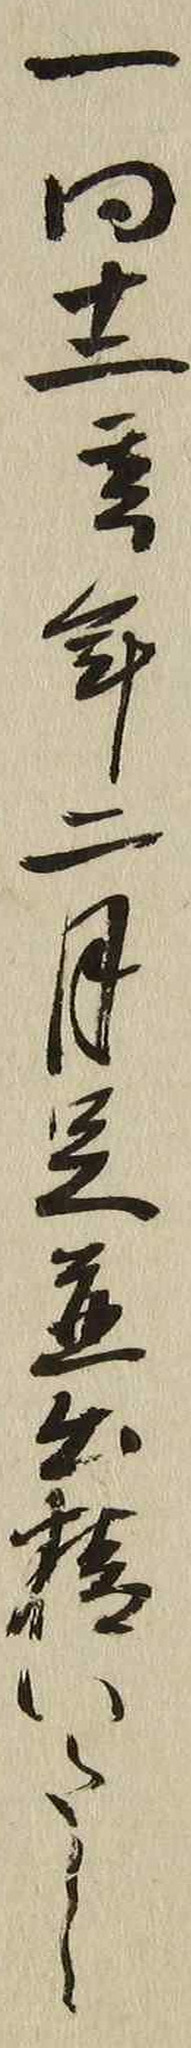一同十二亥年二月足並出精いたし
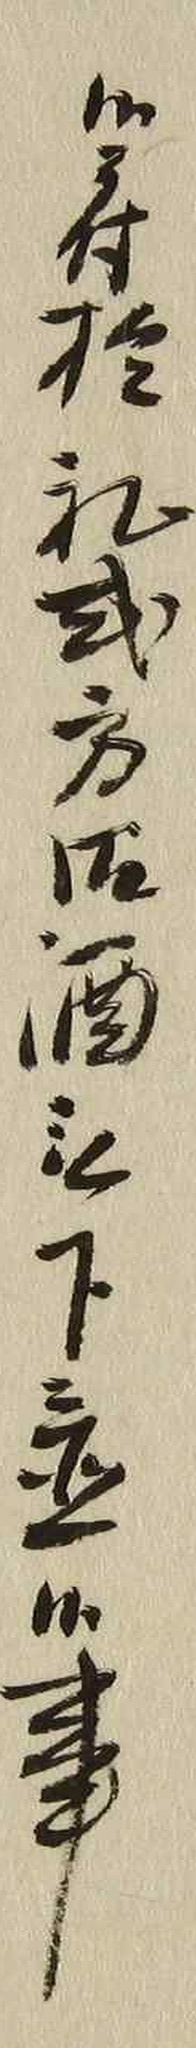候に付於礼式方御酒被下置候事
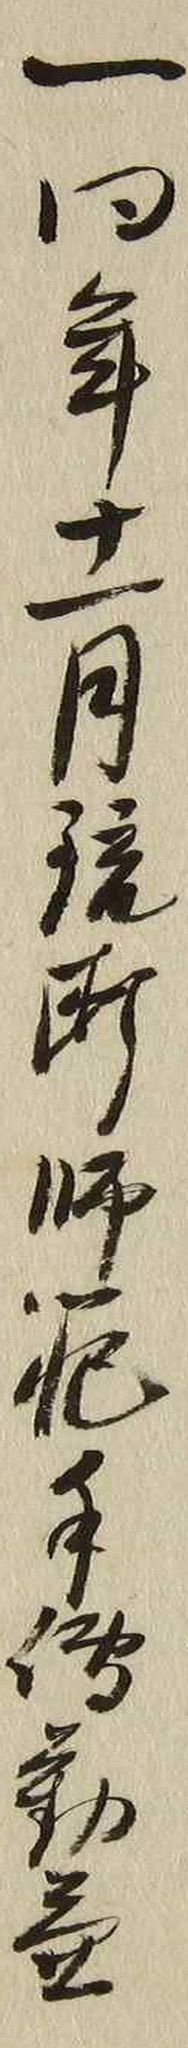一同年十一月銃術師範手伝勤兼
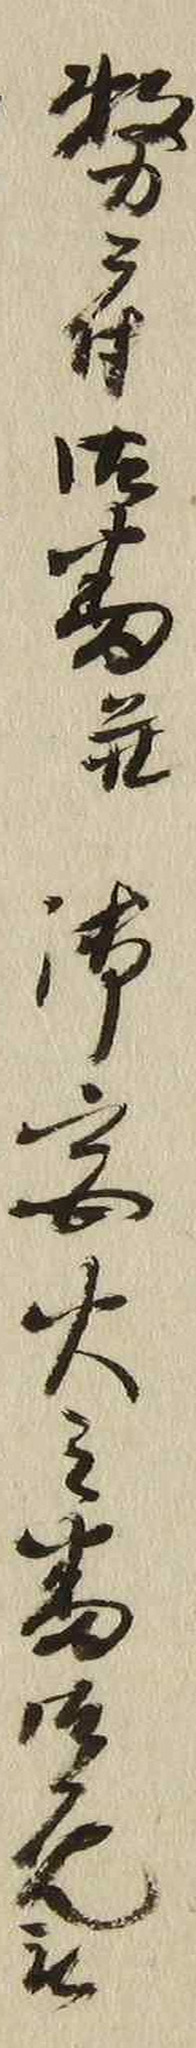務に付御番并御宮火之番御免被
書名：諸士系譜　巻之360　す之部10
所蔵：会津若松市立会津図書館
